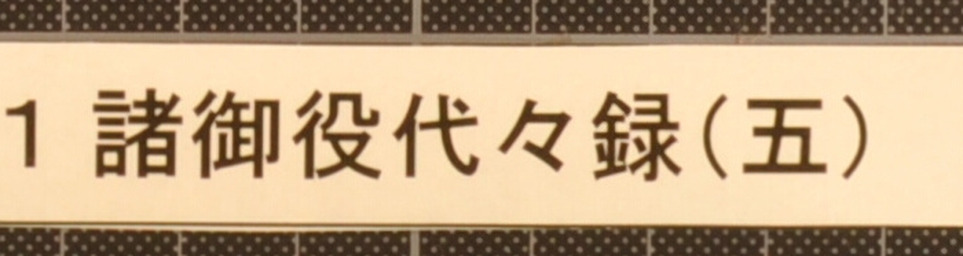諸御役代々録五
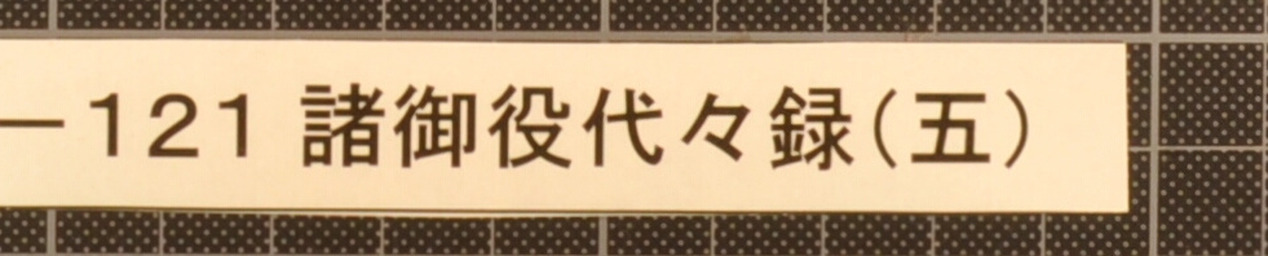諸御役代々録五
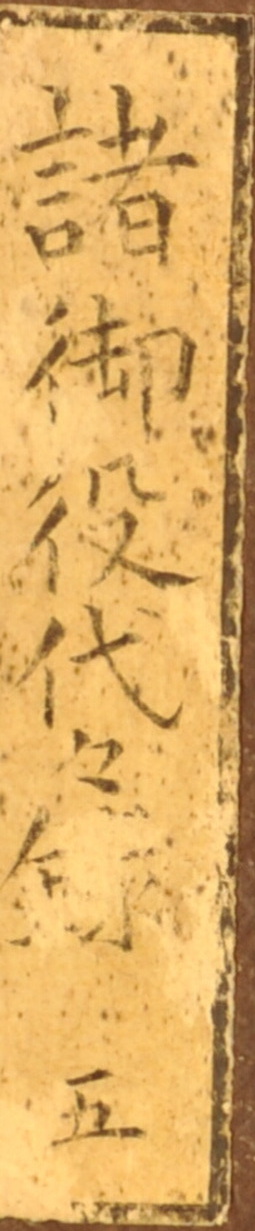諸御役代々録五

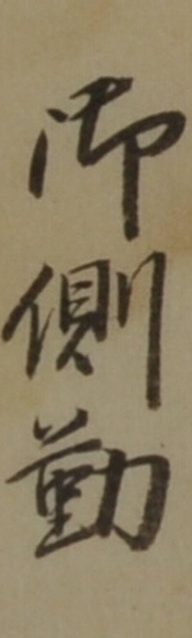御側勤

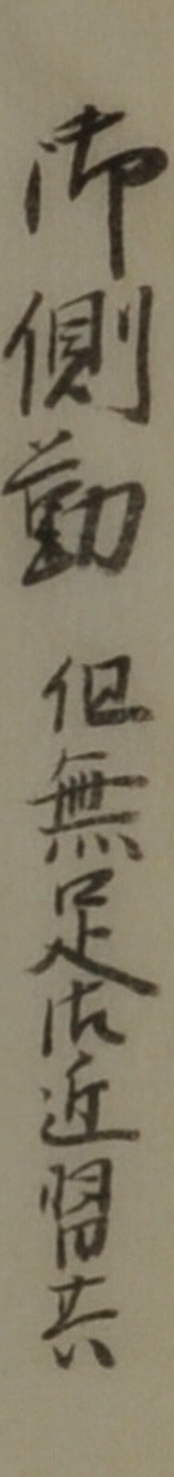御側勤但無足御近習共
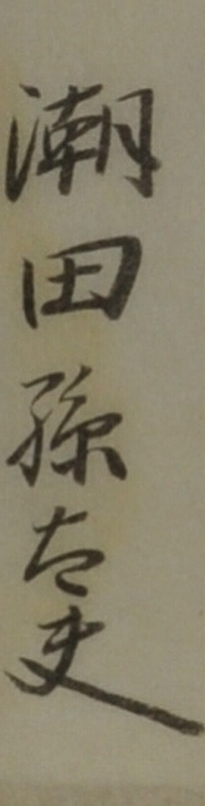潮田孫太夫
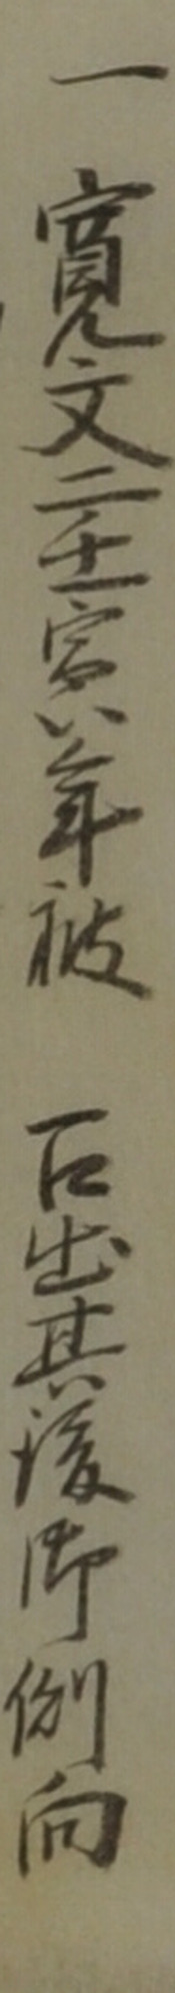一寛文二壬寅年被召出其後御側向
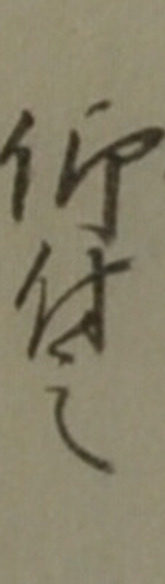仰付之
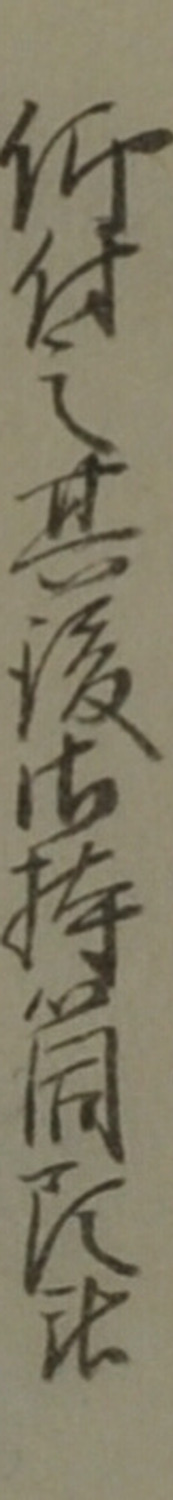仰付之其後御持筒頭被
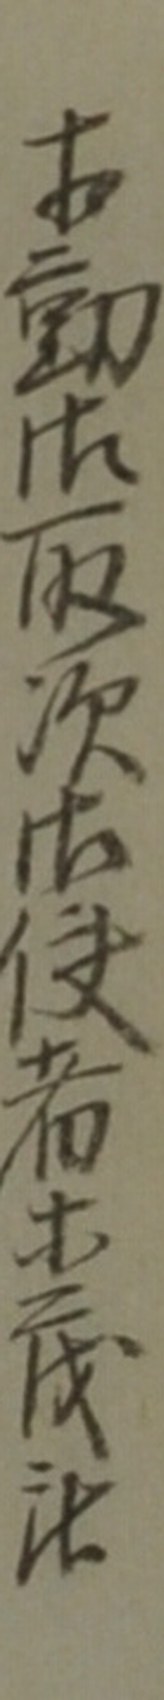相勤御取次御使者等茂被
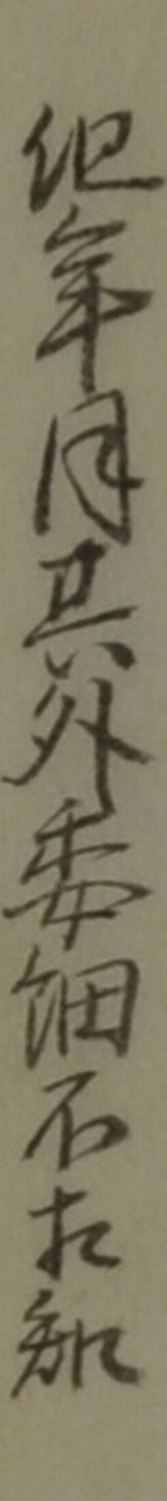但年月其外委細不相知
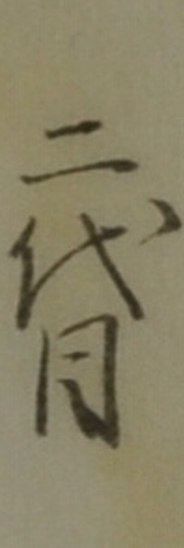二代目
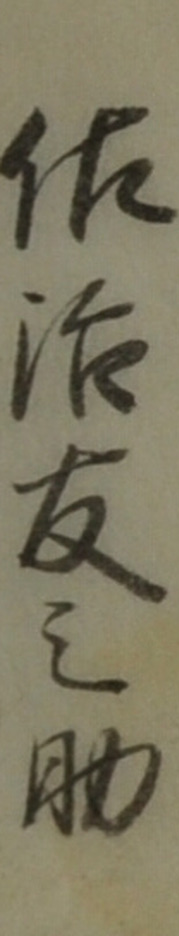佐治友之助
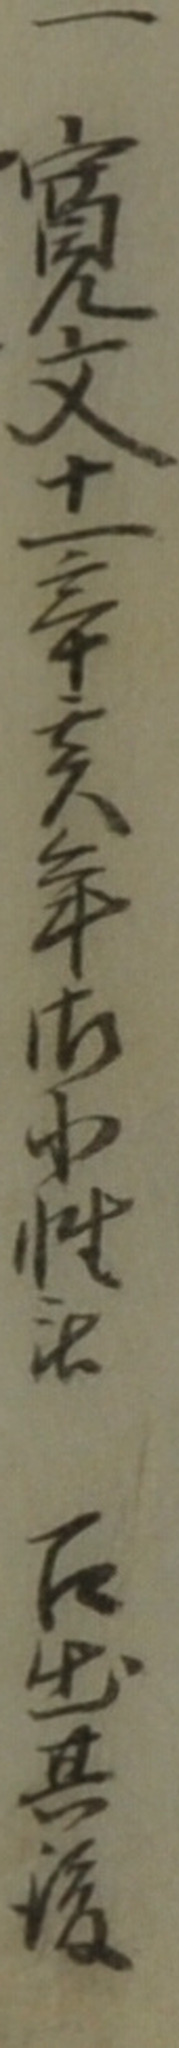一寛文十一辛亥年御小性被召出其後
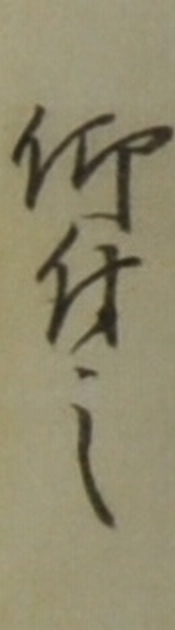仰付之
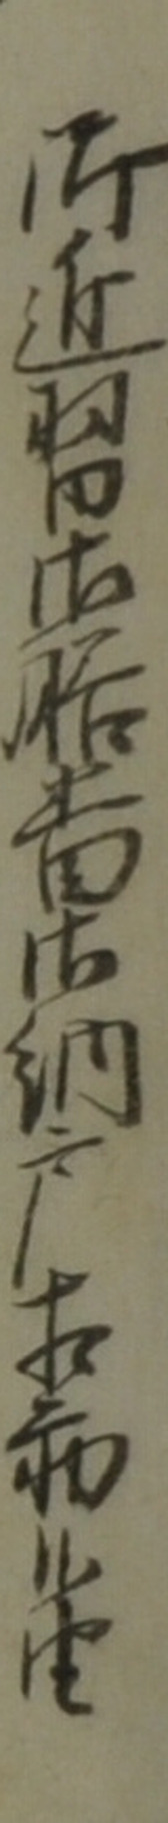御近習御膳番御納戸相勤候由
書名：諸御役代々録（五）
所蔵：伊那市立高遠町図書館・合同会社AMANE
